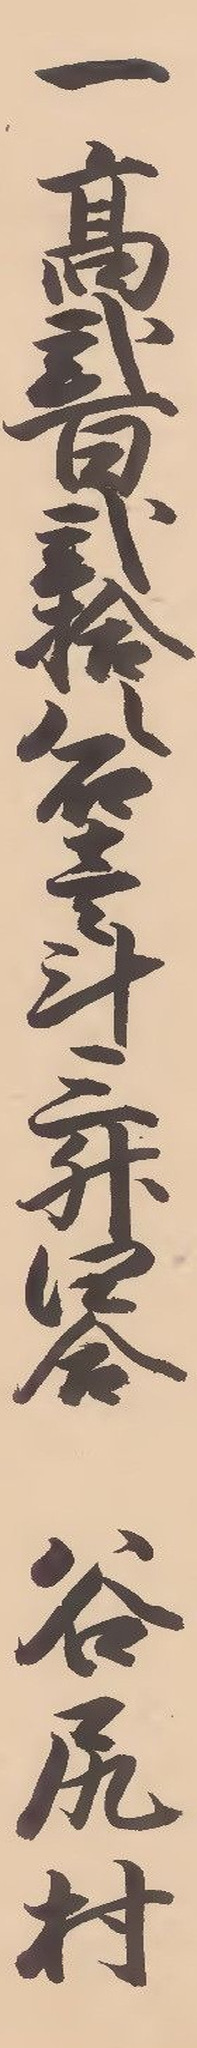一高弐百弐拾八石壱斗三升四合谷尻村

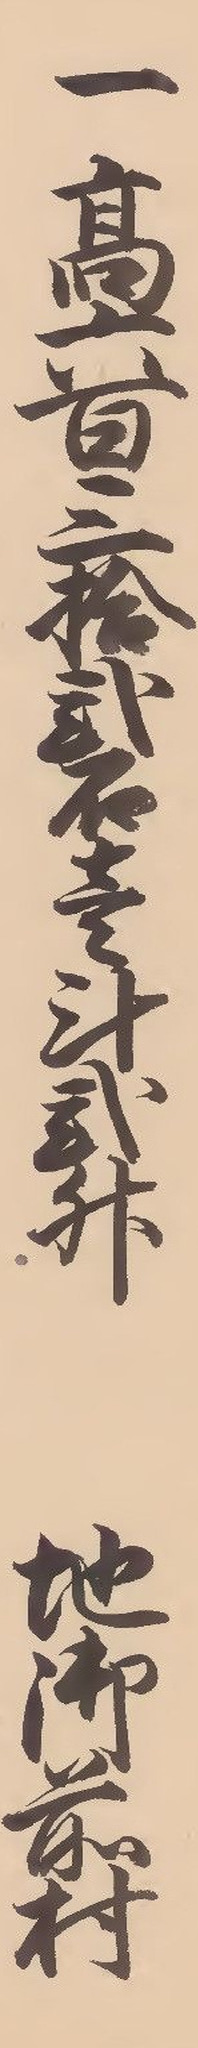一高六百三拾弐石壱斗弐升地御前村
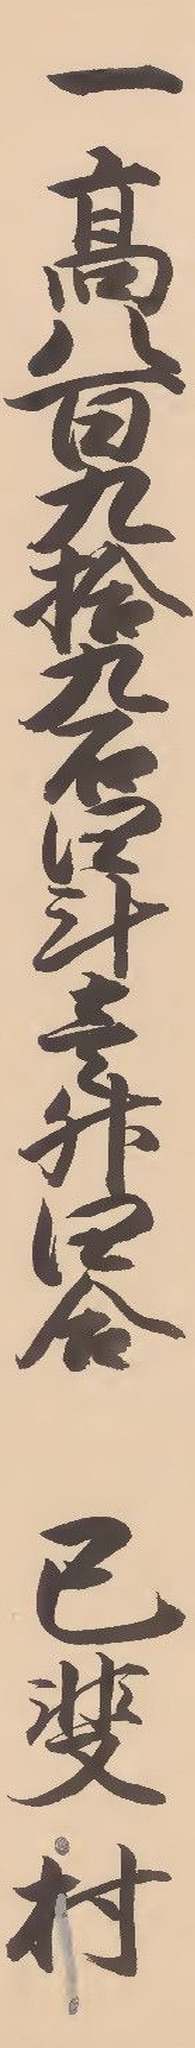一高八百九拾九石四斗壱升四合己斐村
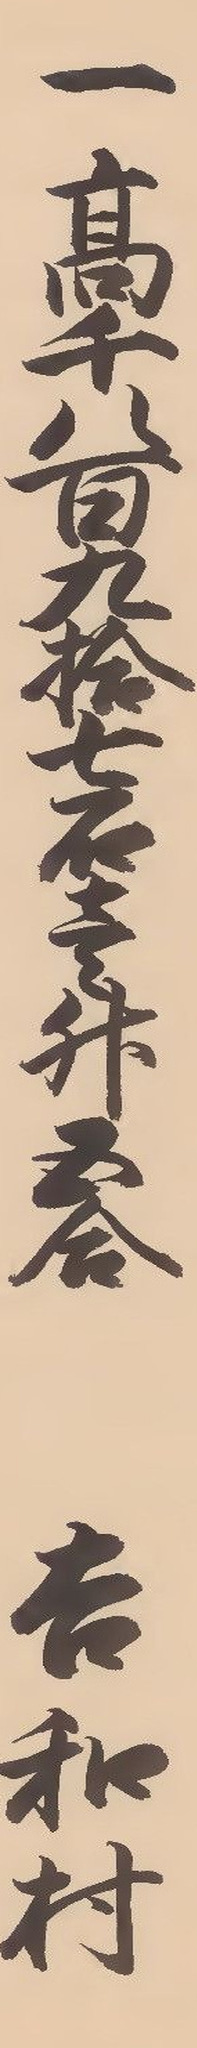一高千八百九拾七石壱升五合吉和村
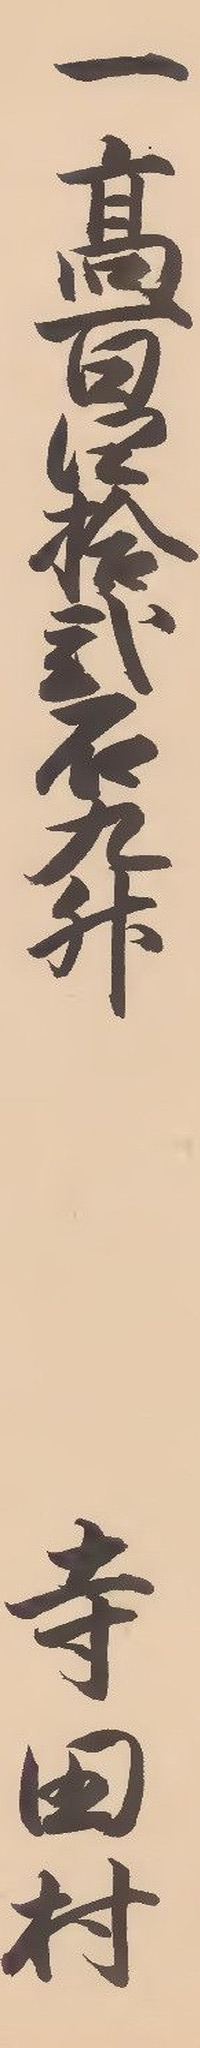一高百四拾弐石九升寺田村
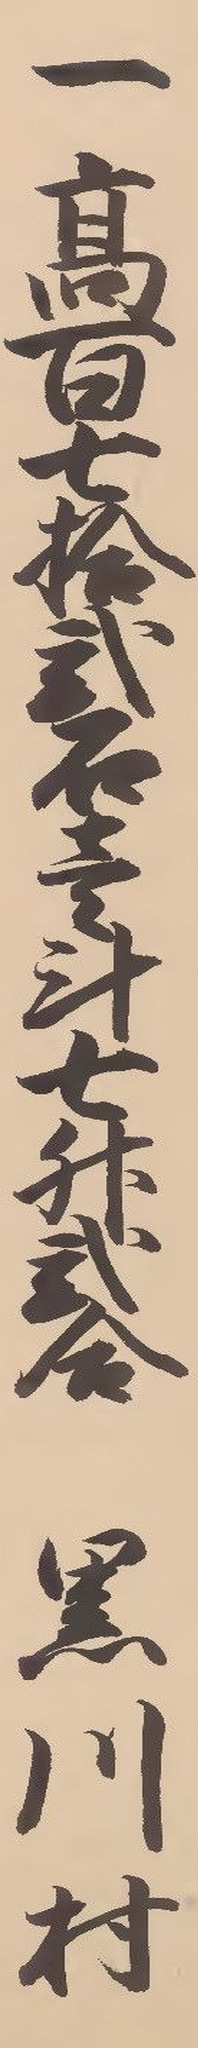一高百七拾弐石壱斗七升弐合黒川村
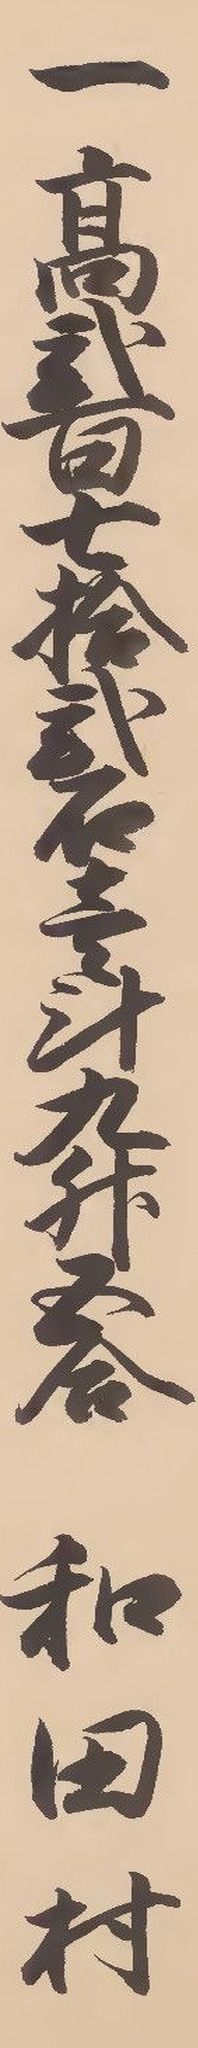一高弐百七拾弐石壱斗九升五合和田村
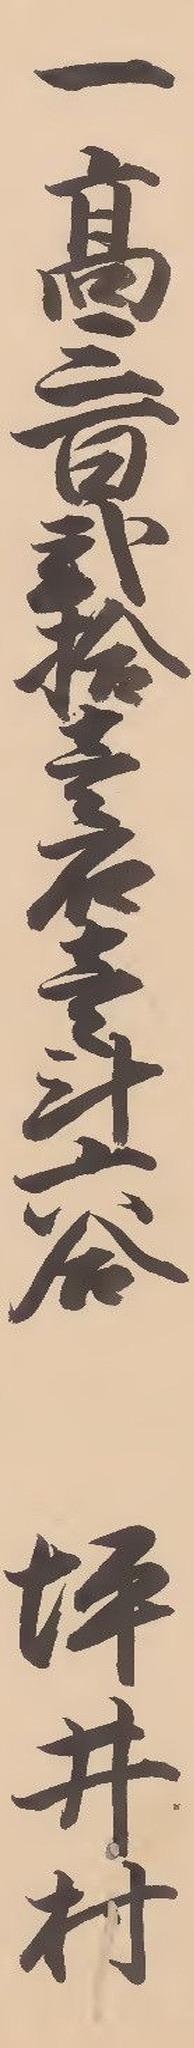一高三百弐拾壱石壱斗六合坪井村
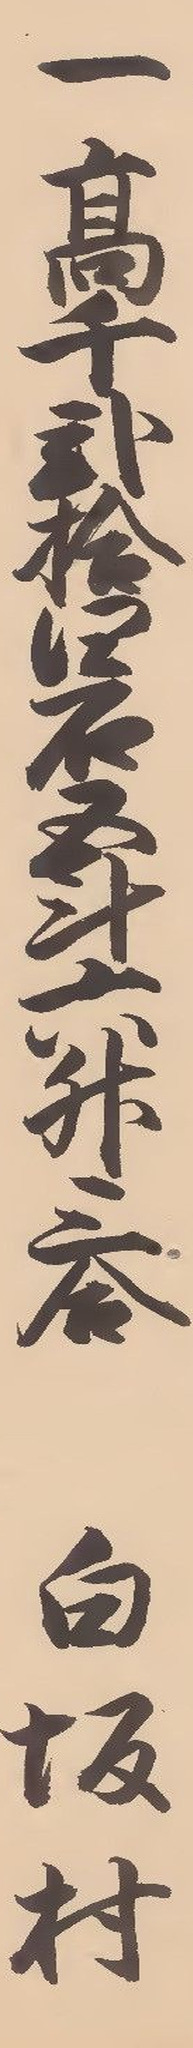一高千弐拾四石五斗六升三合白坂村

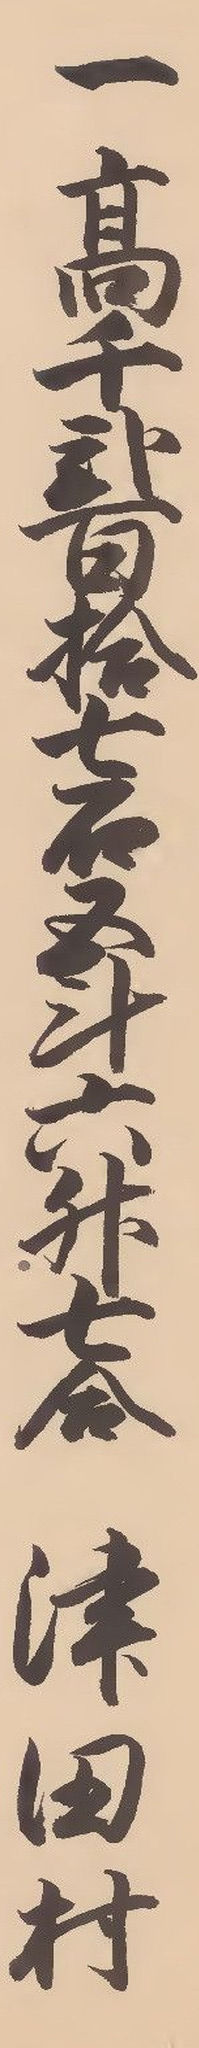一高千弐百拾七石五斗六升七合津田村
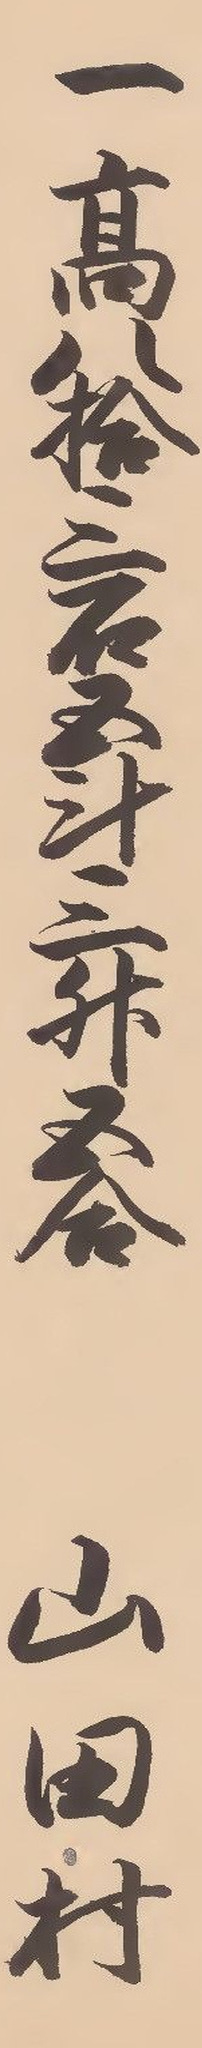一高八拾三石五斗三升五合山田村
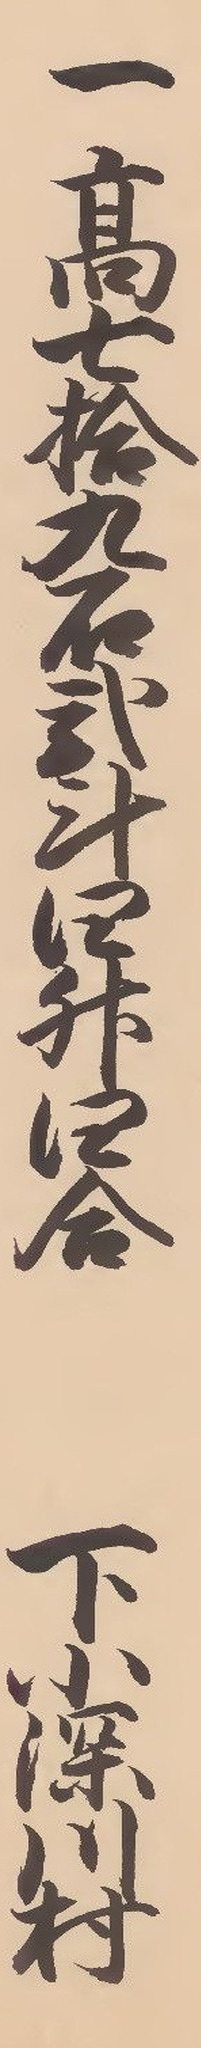一高七拾九石弐斗四升四合下小深川村
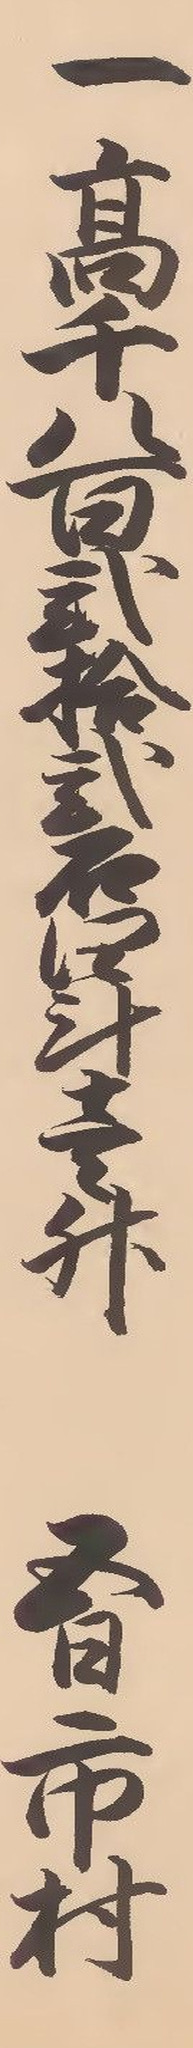一高千八百弐拾弐石四斗壱升五日市村
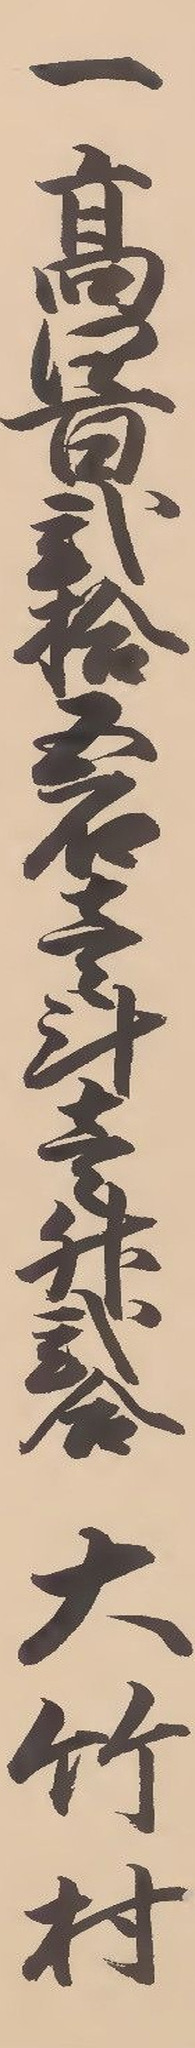一高四百弐拾五石壱斗壱升弐合大竹村
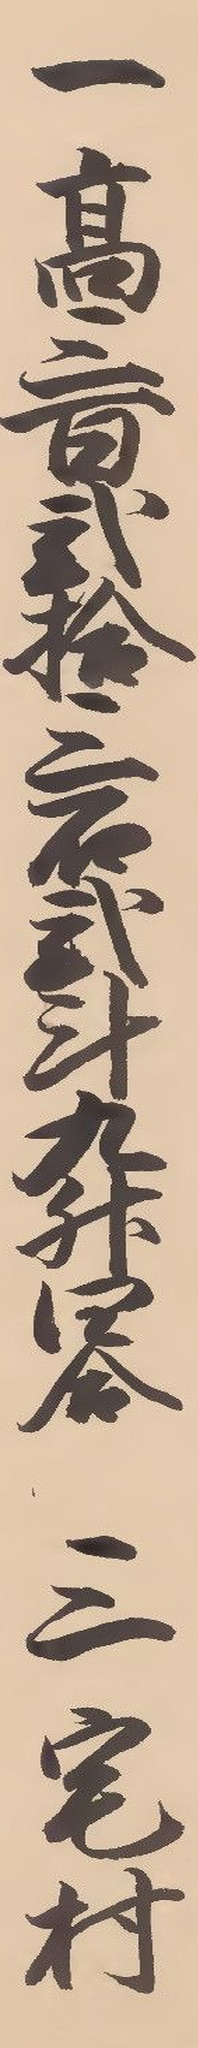一高三百弐拾三石弐斗九升四合三宅村
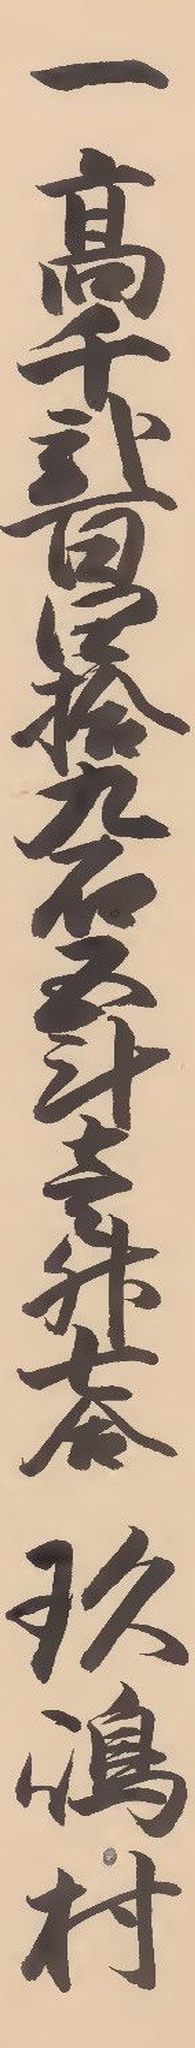一高千弐百四拾九石五斗壱升七合玖島村
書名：安芸国郷帳
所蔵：国立公文書館 National Archives of Japan
